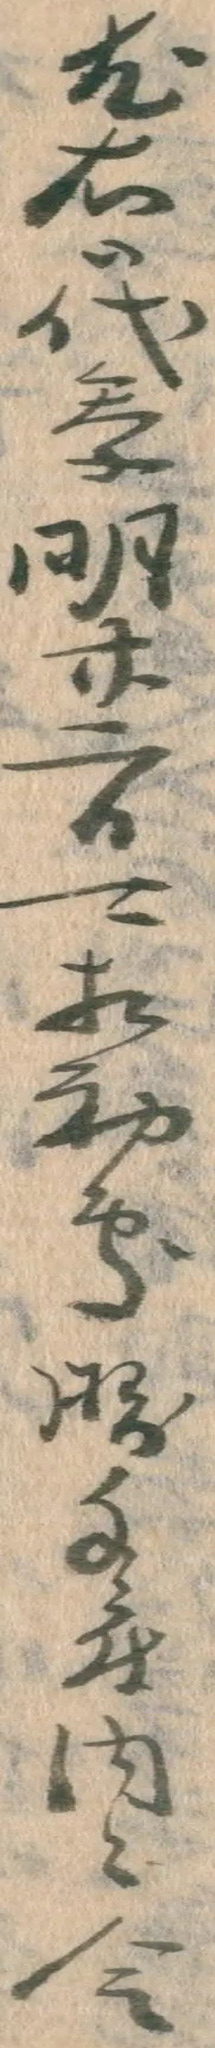尤右御代参、明廿二日可相處、勝手ニ付内々令
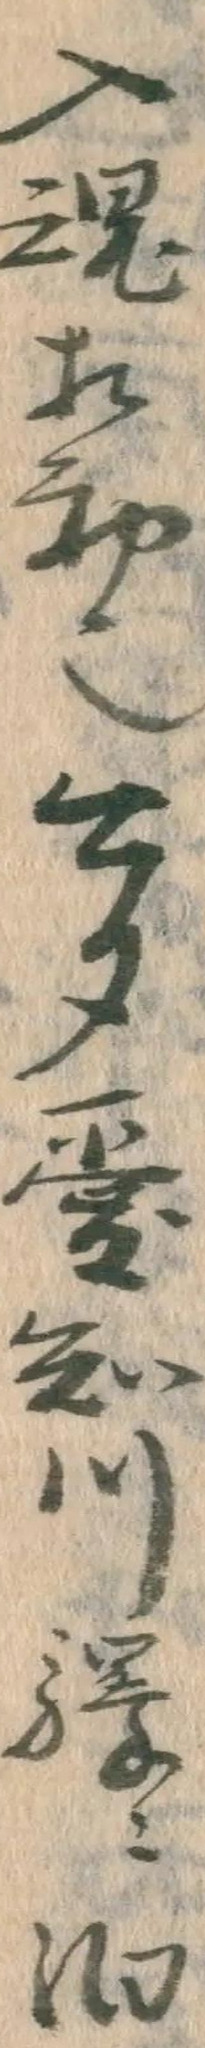入魂相勤也、今夕愛知川駅に泊、
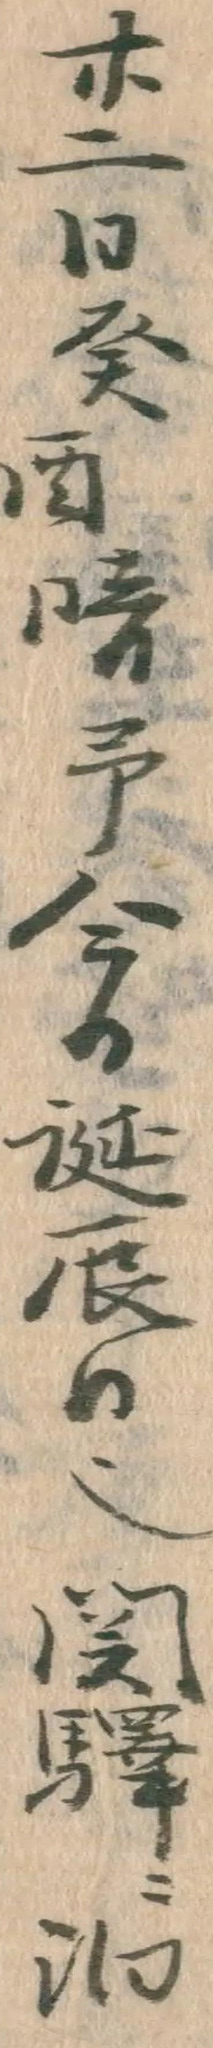廿二日癸酉晴、予今日誕辰日也、関駅ニ泊、
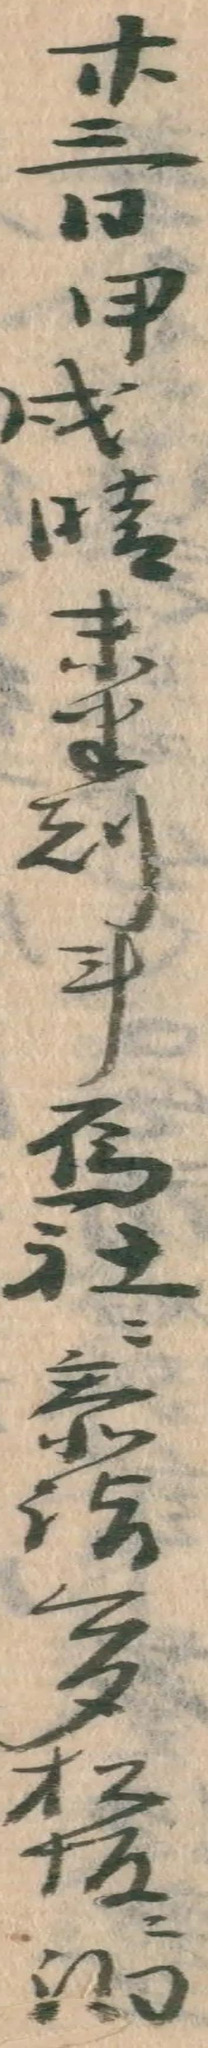廿三日甲戌晴、未半刻斗鳥社に参詣、今夕松坂に泊、
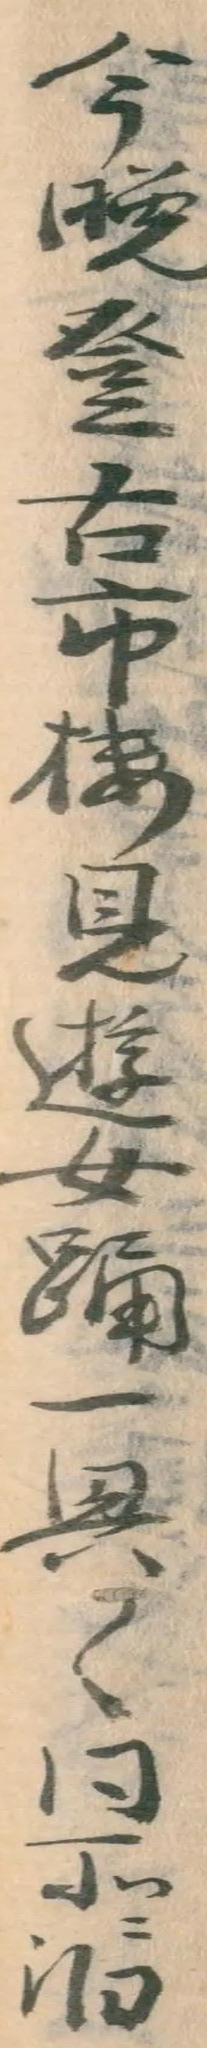今晩登古市桜見、遊女踊一興〳〵、同所ニ泊、
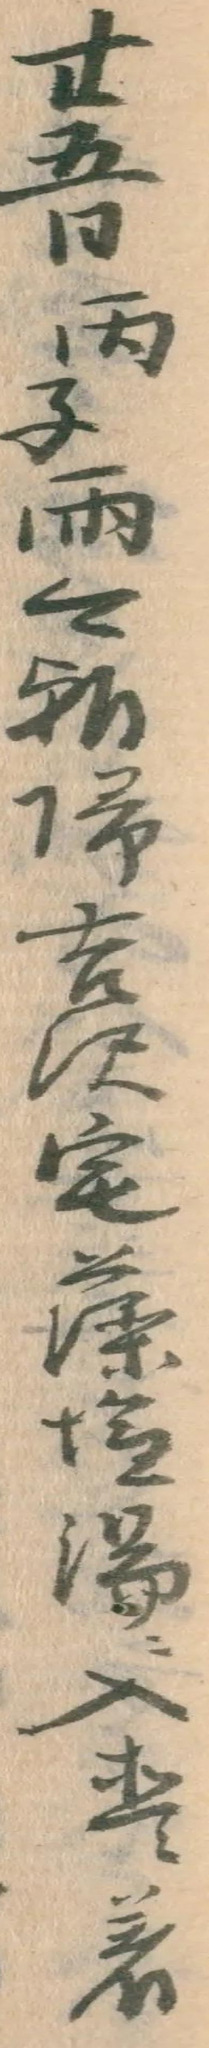廿五日丙子雨、今朝帰吉沢宅、藻塩湯に入直也、着
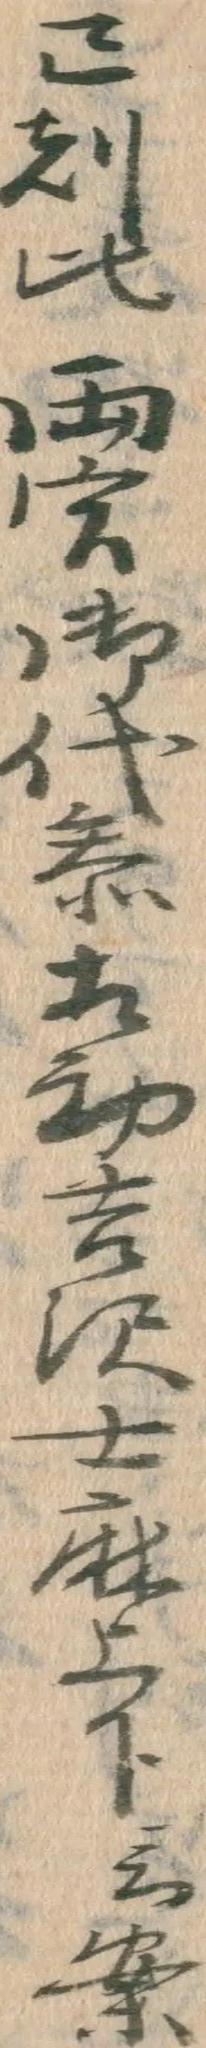巳刻頃両宮御代参相勤、吉沢士麻上下ニ而案
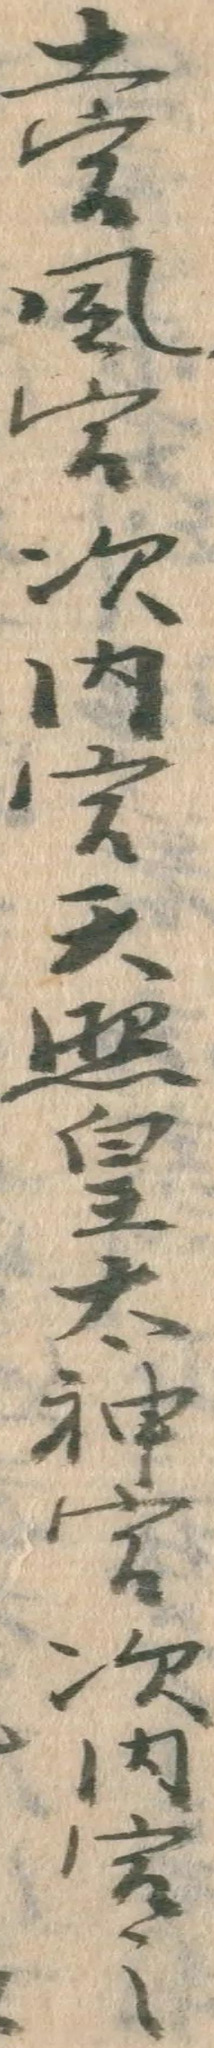土宮・風宮、次内宮天照皇太神宮、次内宮之
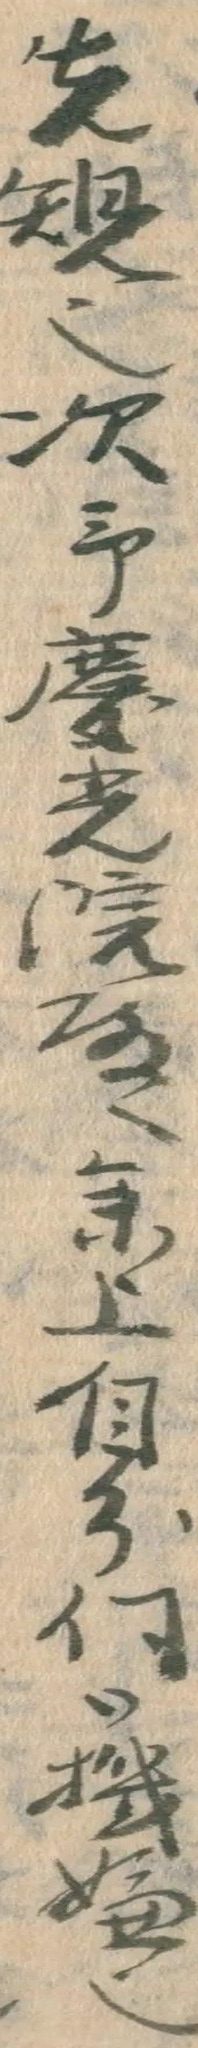先規也、次予慶光院殿へ参上、自分伺御機嫌也、
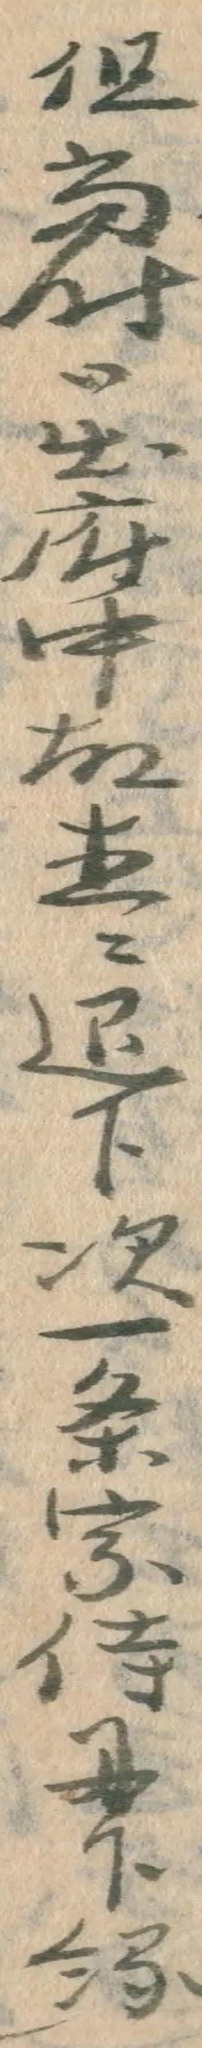但當時御出府中故、直ニ退下、次一条家侍丹下縁
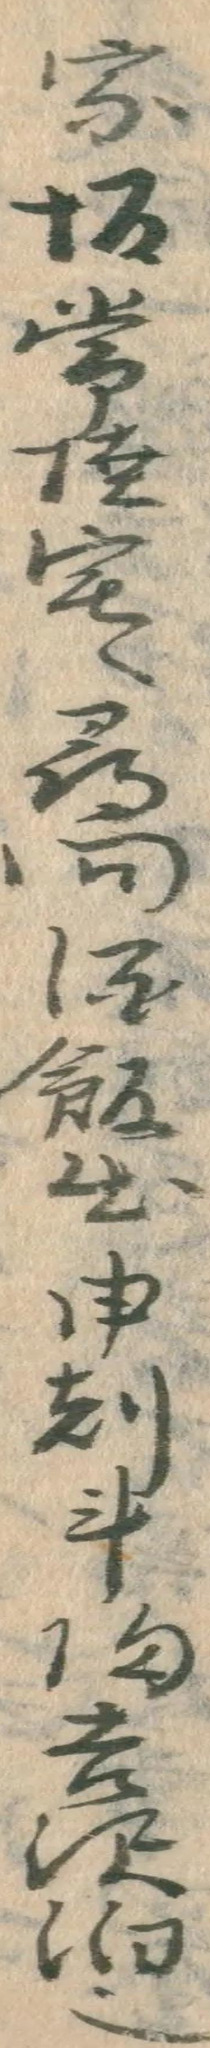家坂常陸宅へ尋向、酒飯出、申刻斗帰吉沢泊也、
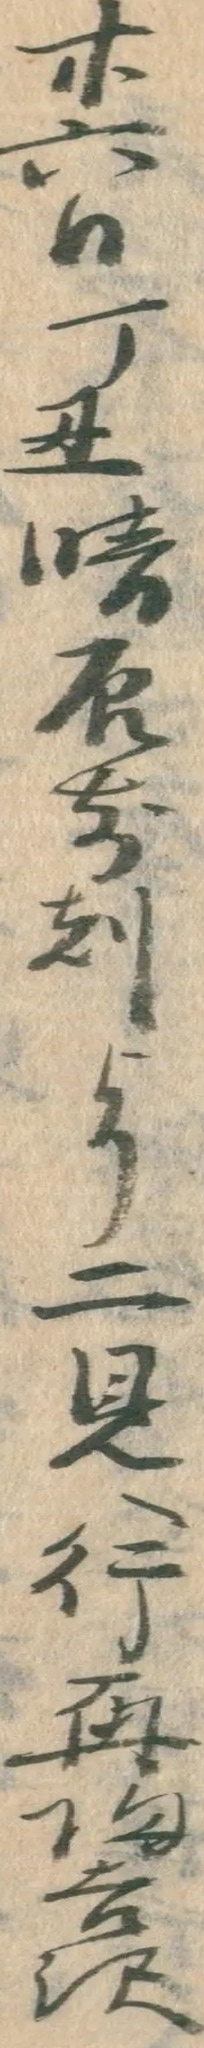廿六日丁丑晴、辰前刻より二見へ行、再帰吉沢、

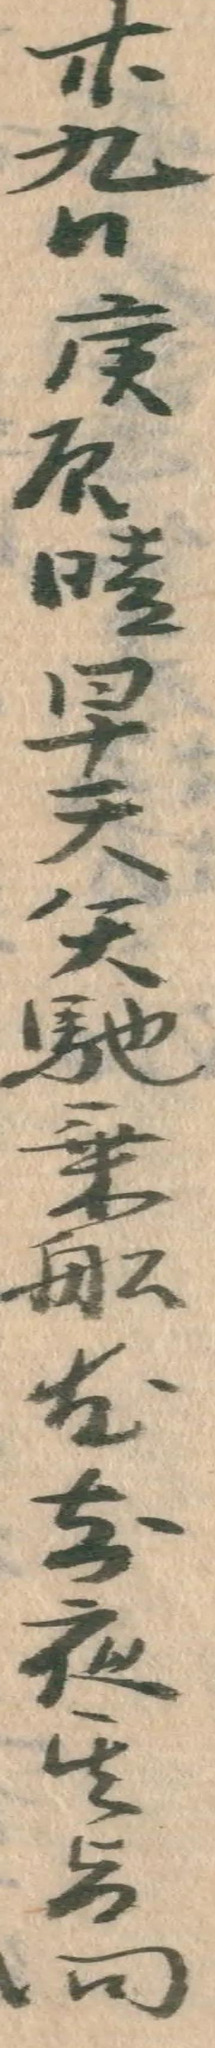廿九日庚辰晴、早天矢馳乗船、尤前夜、其旨向
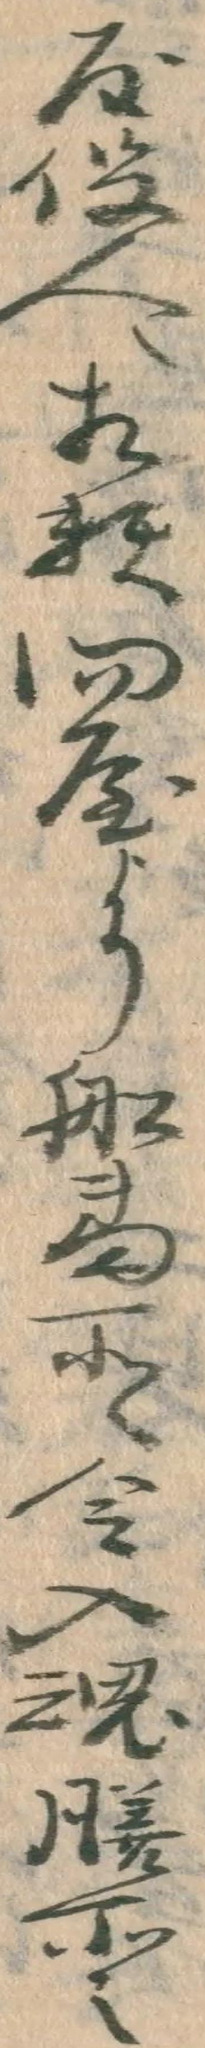屋役人へ相頼、問屋より船番所へ令入魂、膳所之
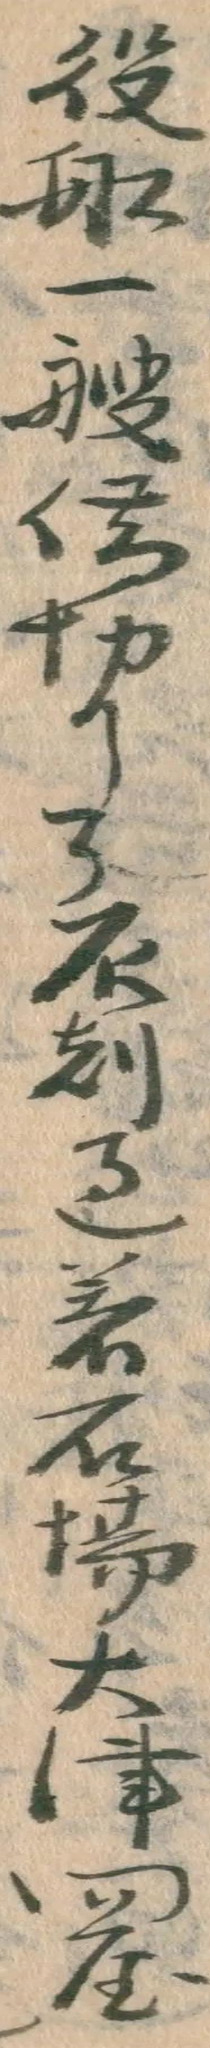役船一艘借切に了、辰刻過着、石場・大津問屋
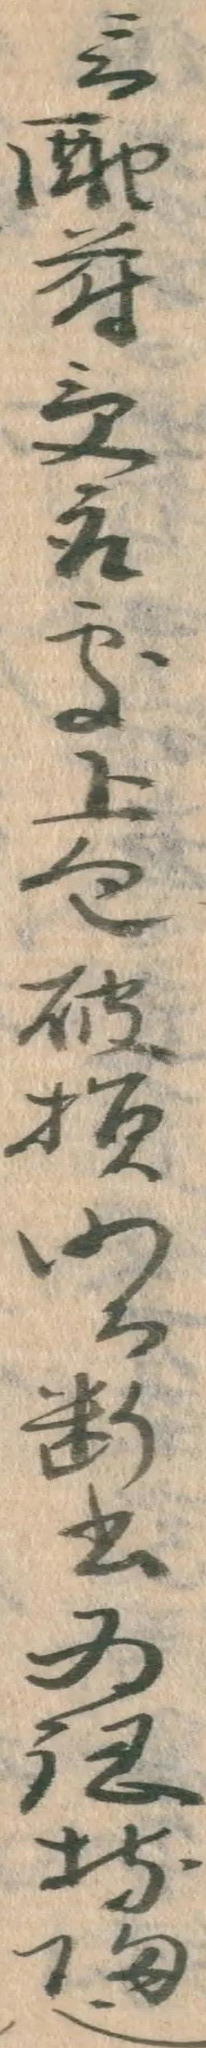ニ而配附受取處、上包破損、仍而断書為認持帰也、
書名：賀茂社記録. 第63冊
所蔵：国立国会図書館 National Diet Library, JAPAN
